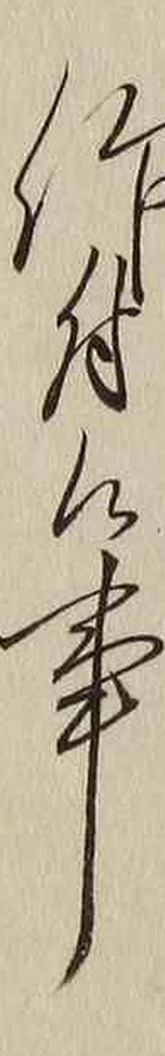仰付候事
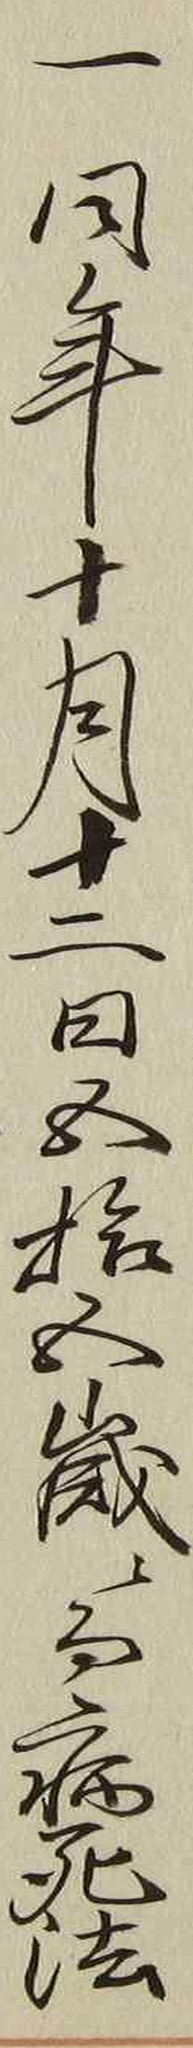一同年十月十二日五拾五歳ニ而病死法
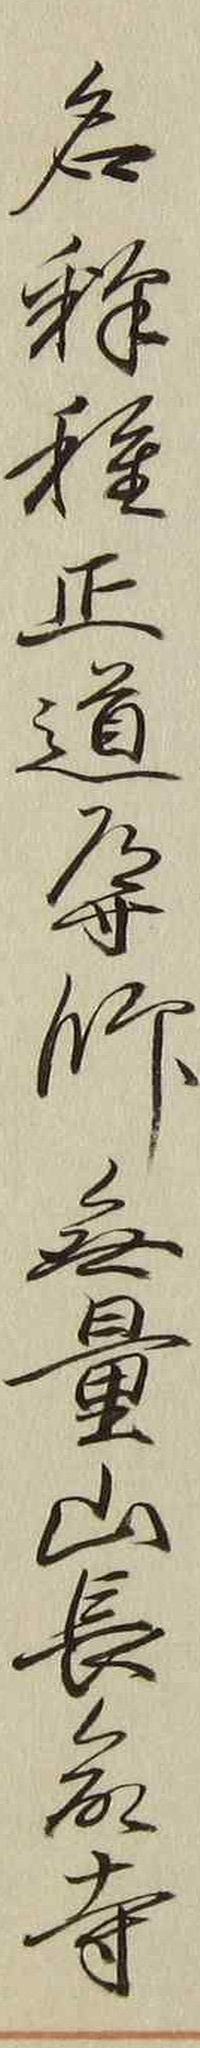名釈種正道導師無量山長命寺
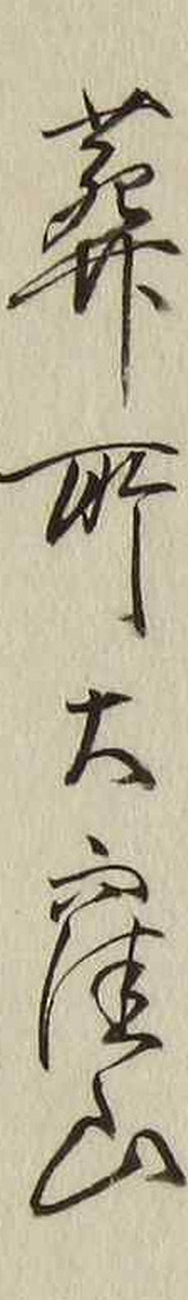葬所大窪山
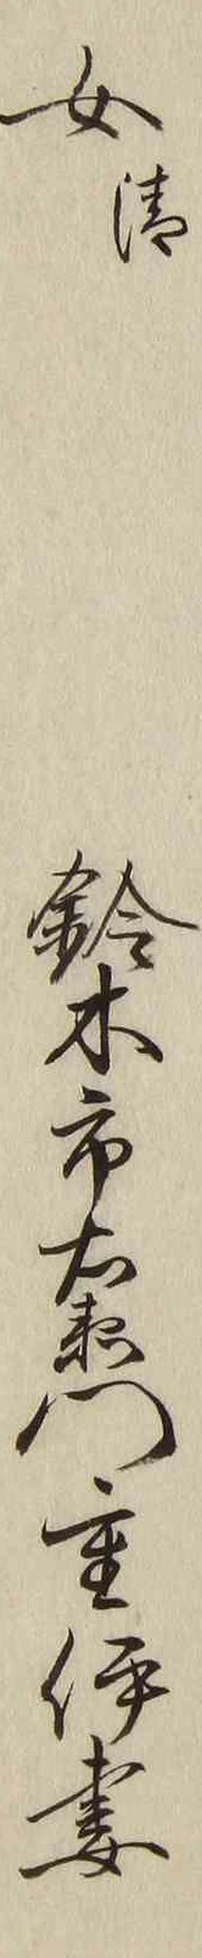女清鈴木市右衛門重伊妻

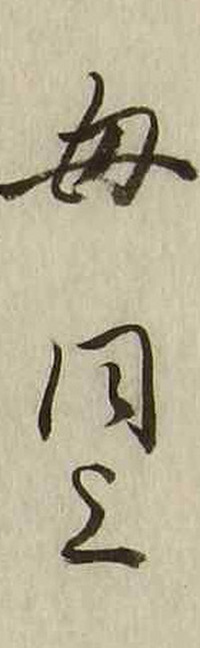母同上
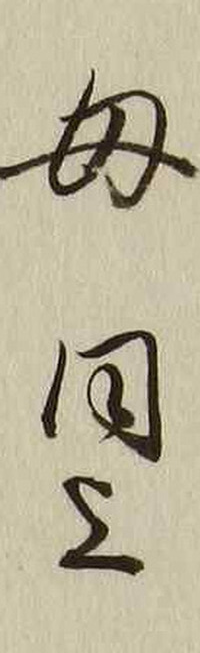母同上
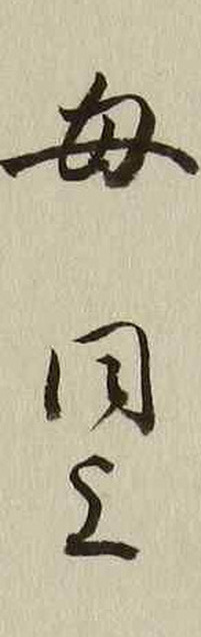母同上
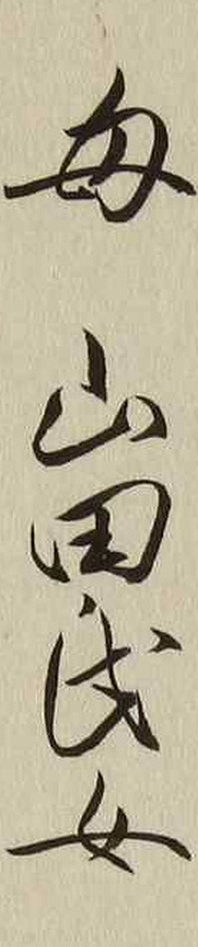母山田氏女
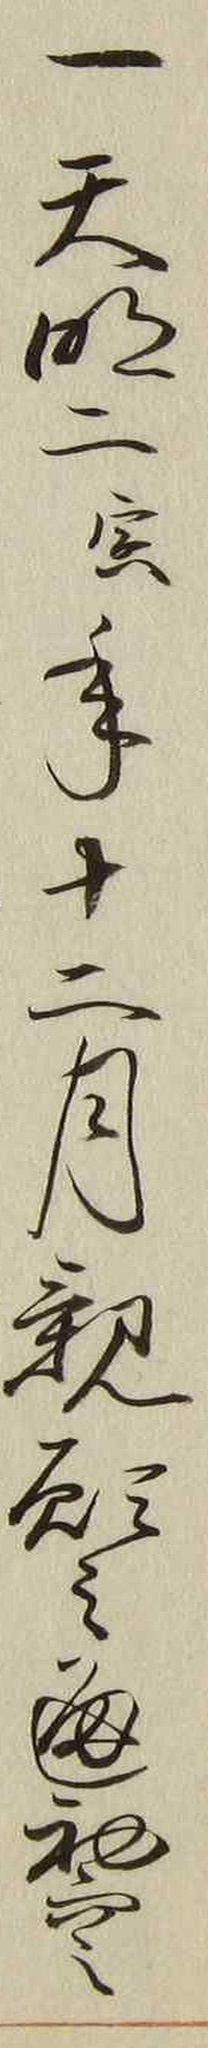一天明二寅年十二月親願之通初而之
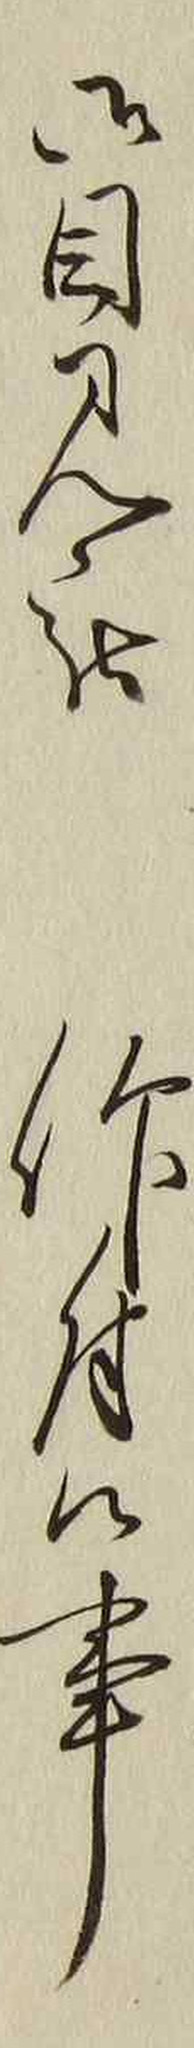御目見被仰付候事
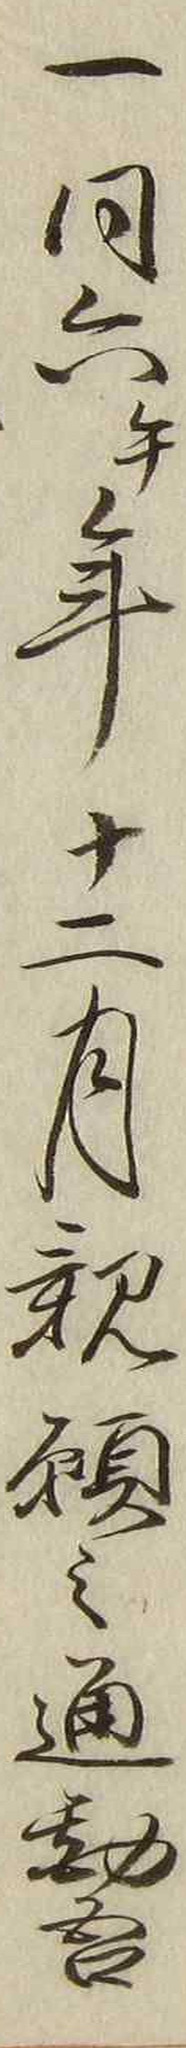一同六午年十二月親願之通勘吾
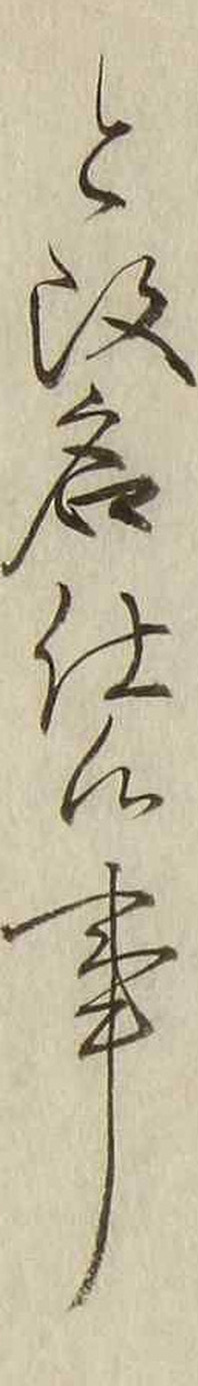と改名仕候事

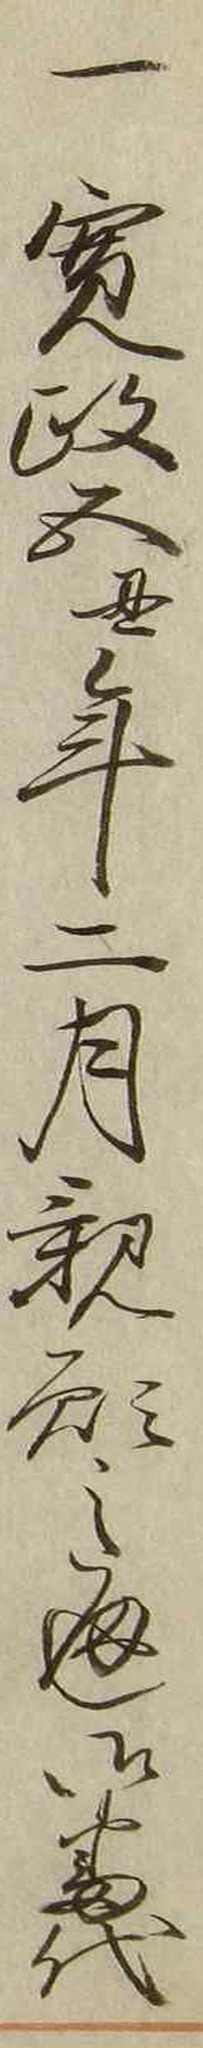一寛政五丑年二月親願之通御番代
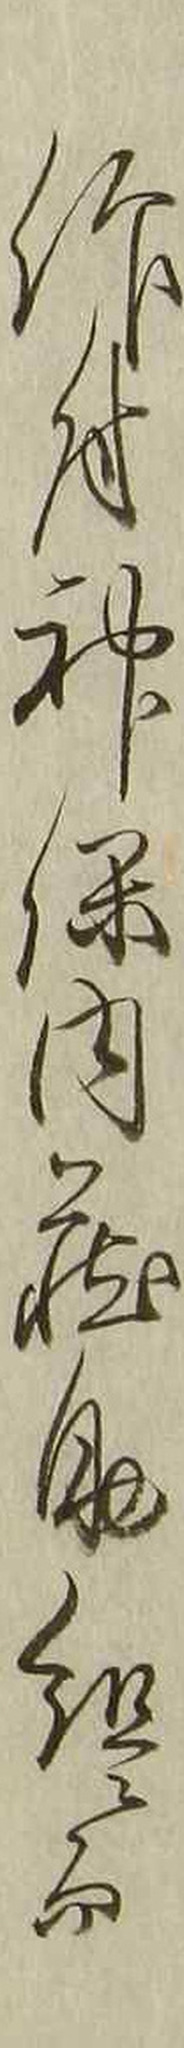被仰付神保内蔵助組ニ而
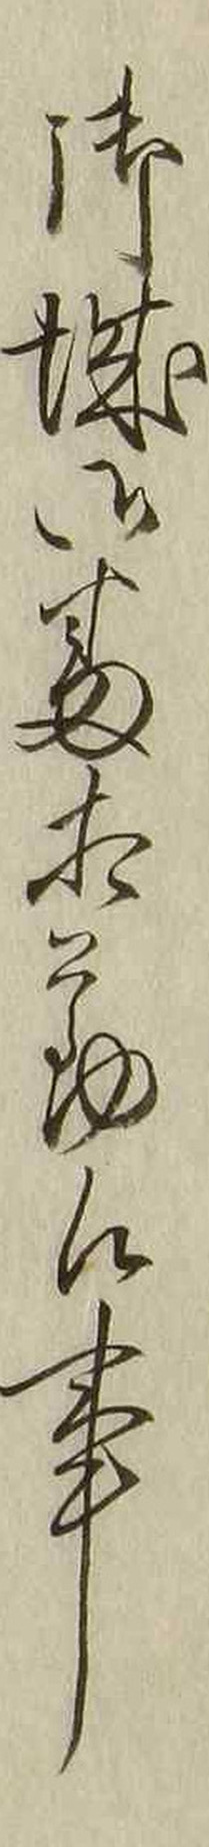御城御番相勤候事
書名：諸士系譜　巻之54　ほ之部1
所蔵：会津若松市立会津図書館
